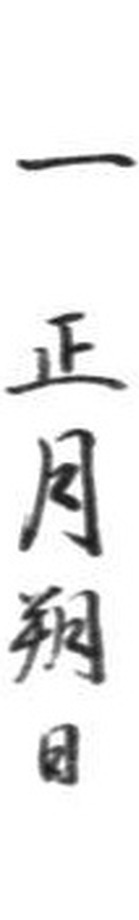一正月朔日
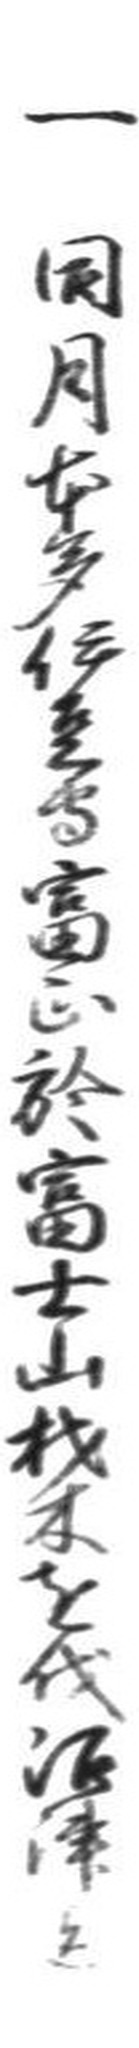一同月本多伊豆守富正於富士山材木を伐沼津迄
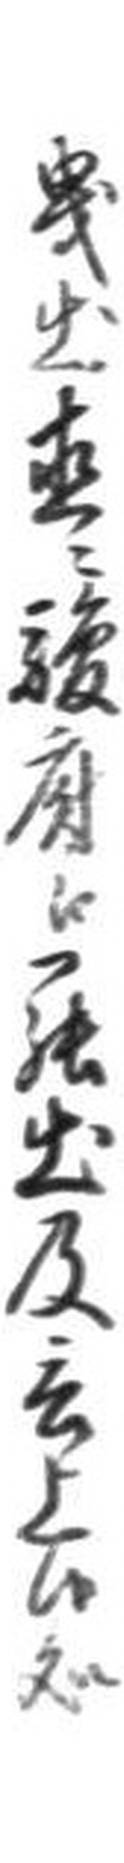曳出直ニ駿府江罷出及言上候処
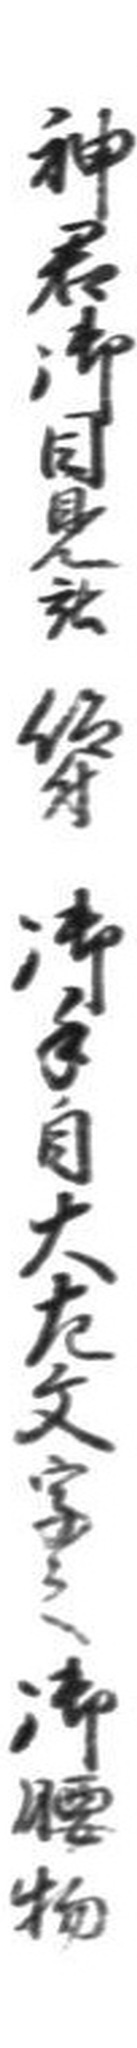神君御目見被仰付御手自大左文字之御腰物
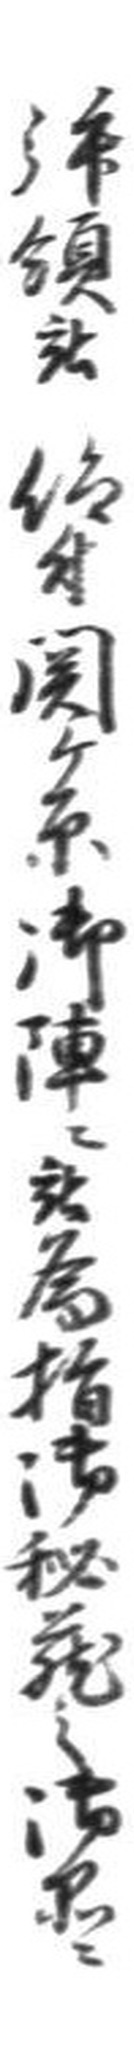拝領被仰付関ヶ原御陣ニ被為指御秘蔵之御品ニ
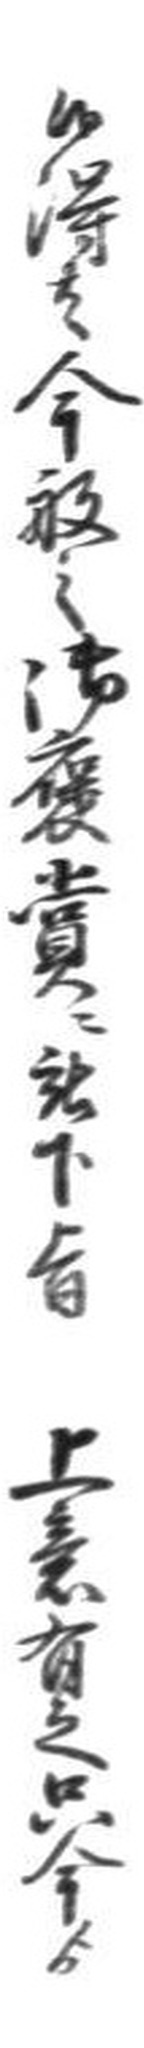候得共今般之御褒賞ニ被下旨上意有之只今ゟ
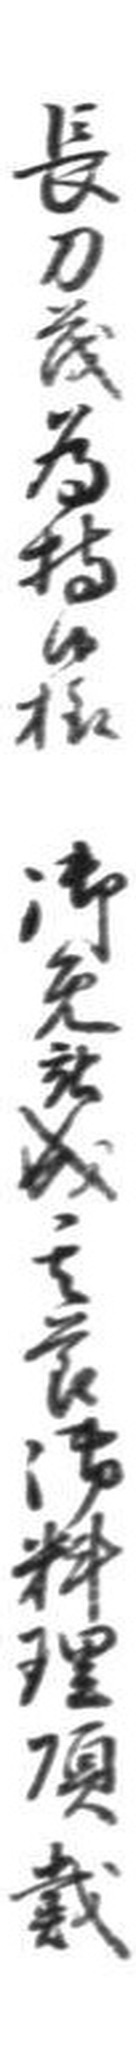長刀も為持候様御免被成其節御料理頂戴

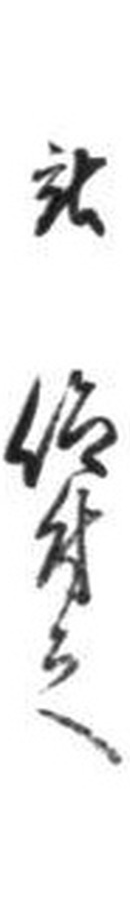被仰付之
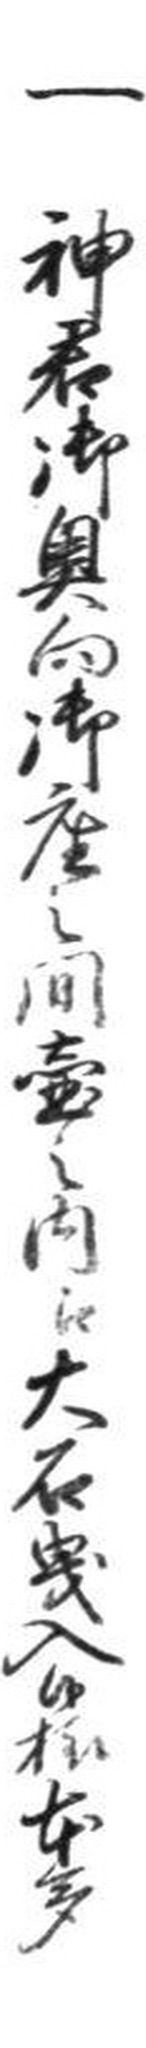一神君御奥向御座之間壺之内江大石曳入候様本多
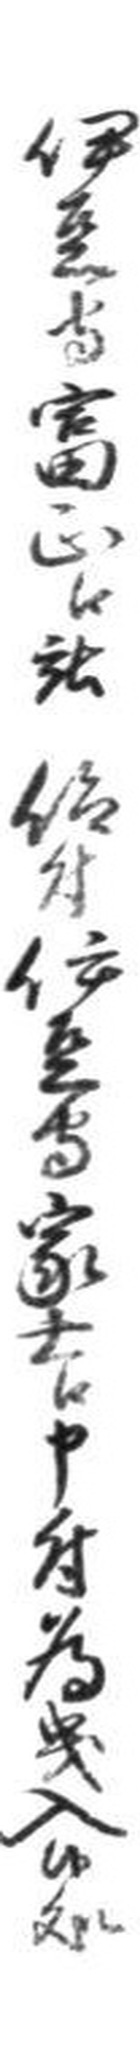伊豆守富正江被仰付伊豆守家士江申付為曳入候処
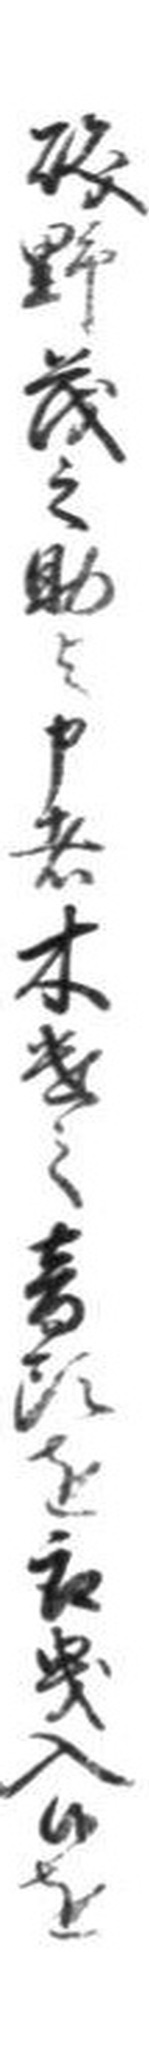磯野茂之助と申者木遣之音頭を取曳入候を
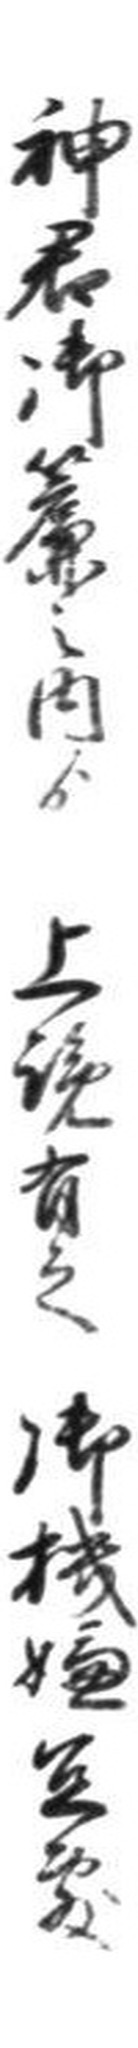神君御簾之内ゟ上覧有之御機嫌宜敷
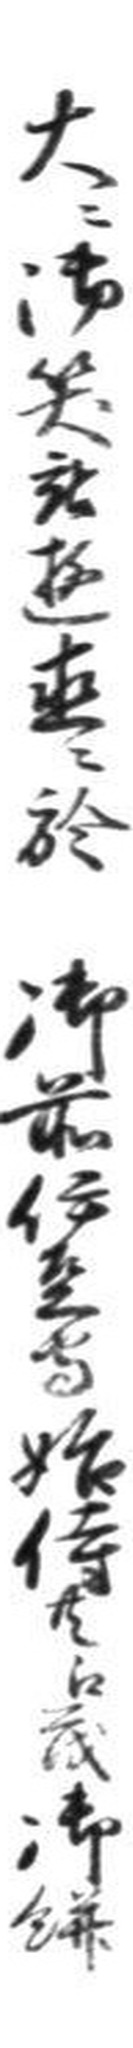大ニ御笑被遊直ニ於御前伊豆守始侍共江も御餅
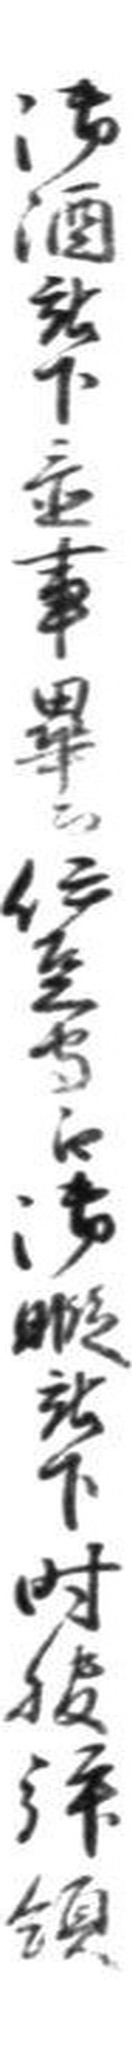御酒被下置事畢而伊豆守江御暇被下時服拝領
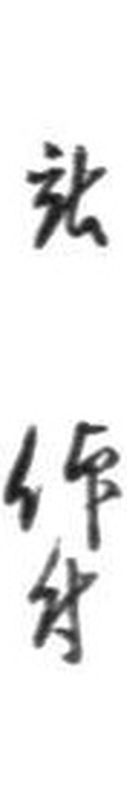被仰付
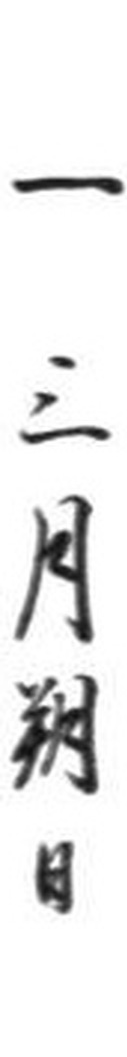一三月朔日
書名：家譜 一 秀康公 従天正二年到慶長十二年
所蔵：福井県文書館 Fukui Prefectural Archives
